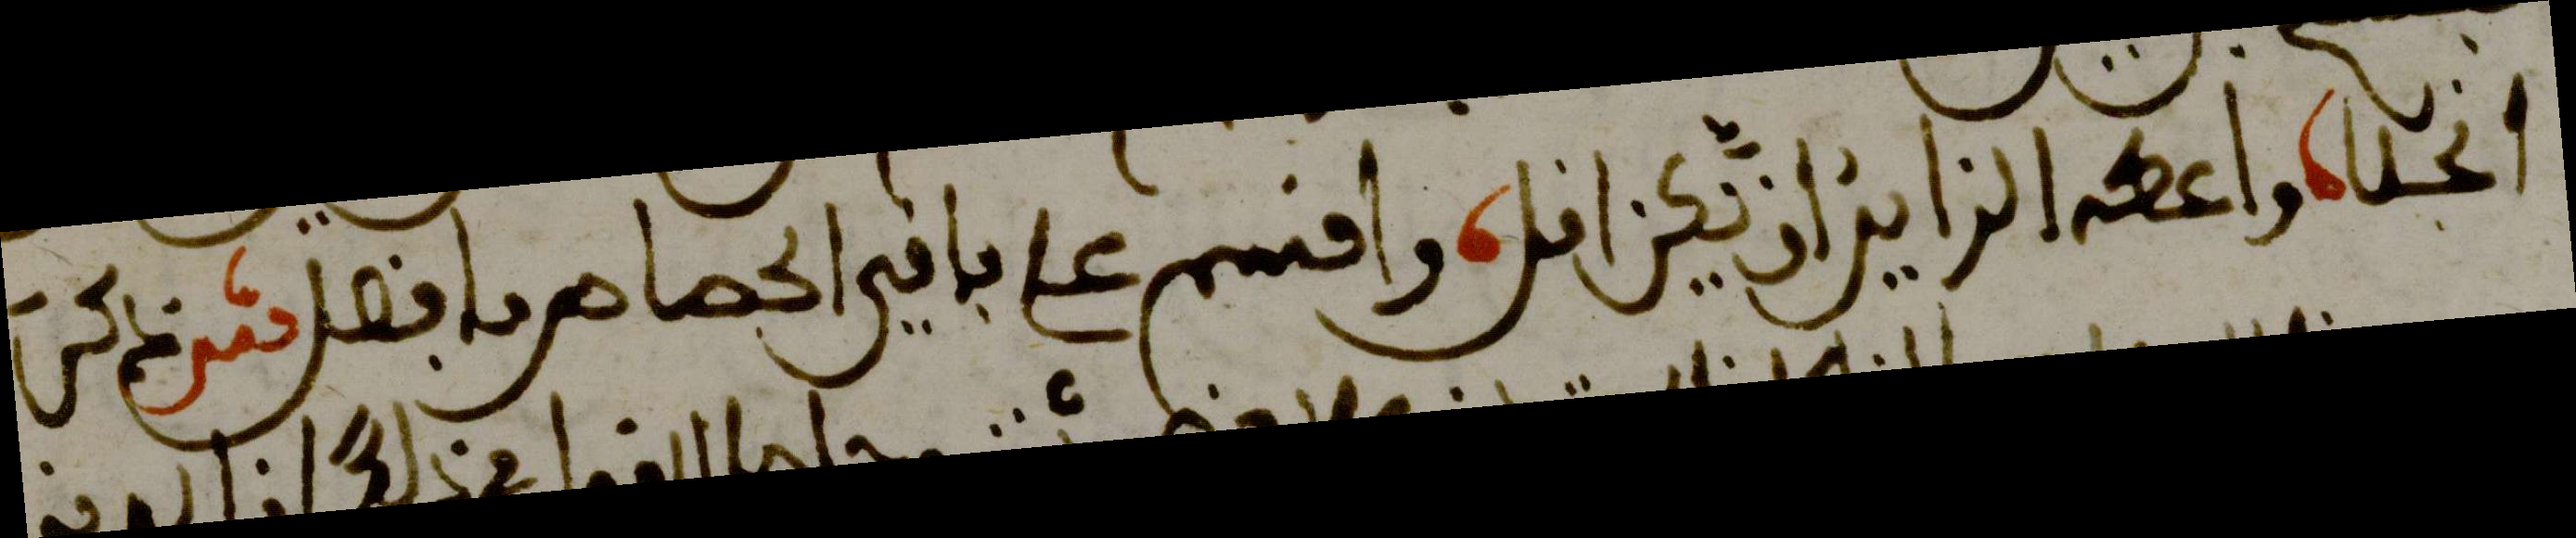انجلا واعطه الزايد ان يكن اقل واقسم على باقي الحصاص ما فضل ش ذكر
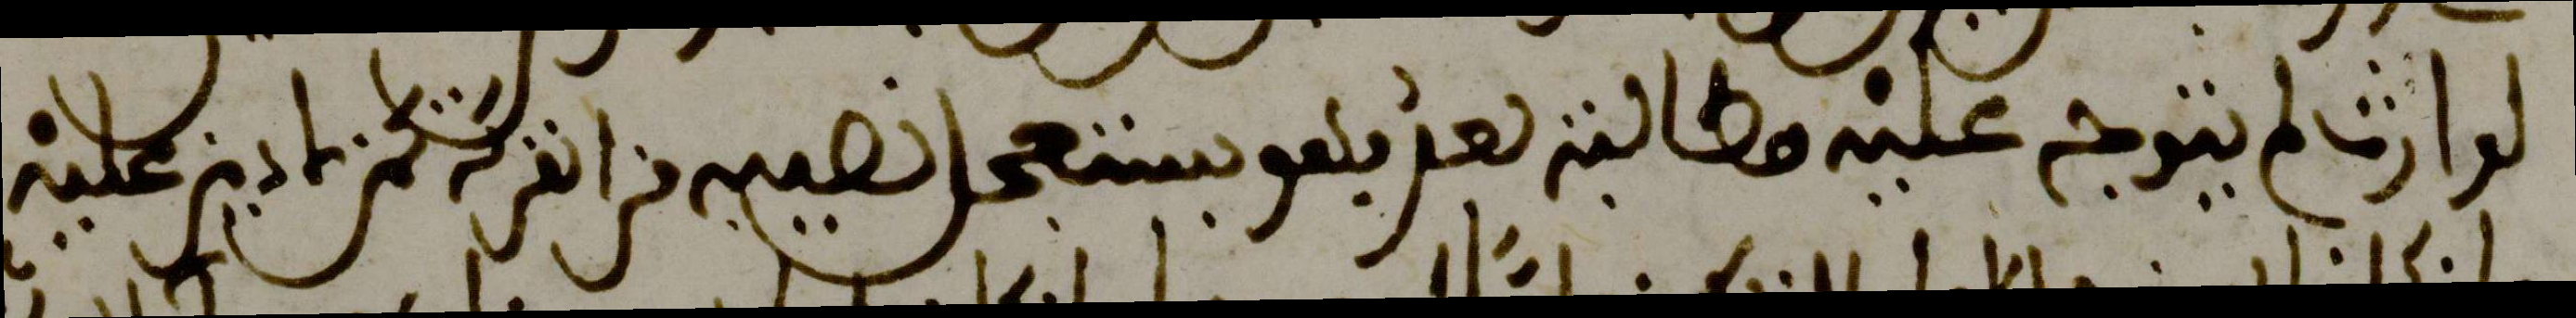لوارث لم يتوجه عليْه مطالبته بعد فهو يستعجل نصيبه من التركة كمن لا دين عليْه
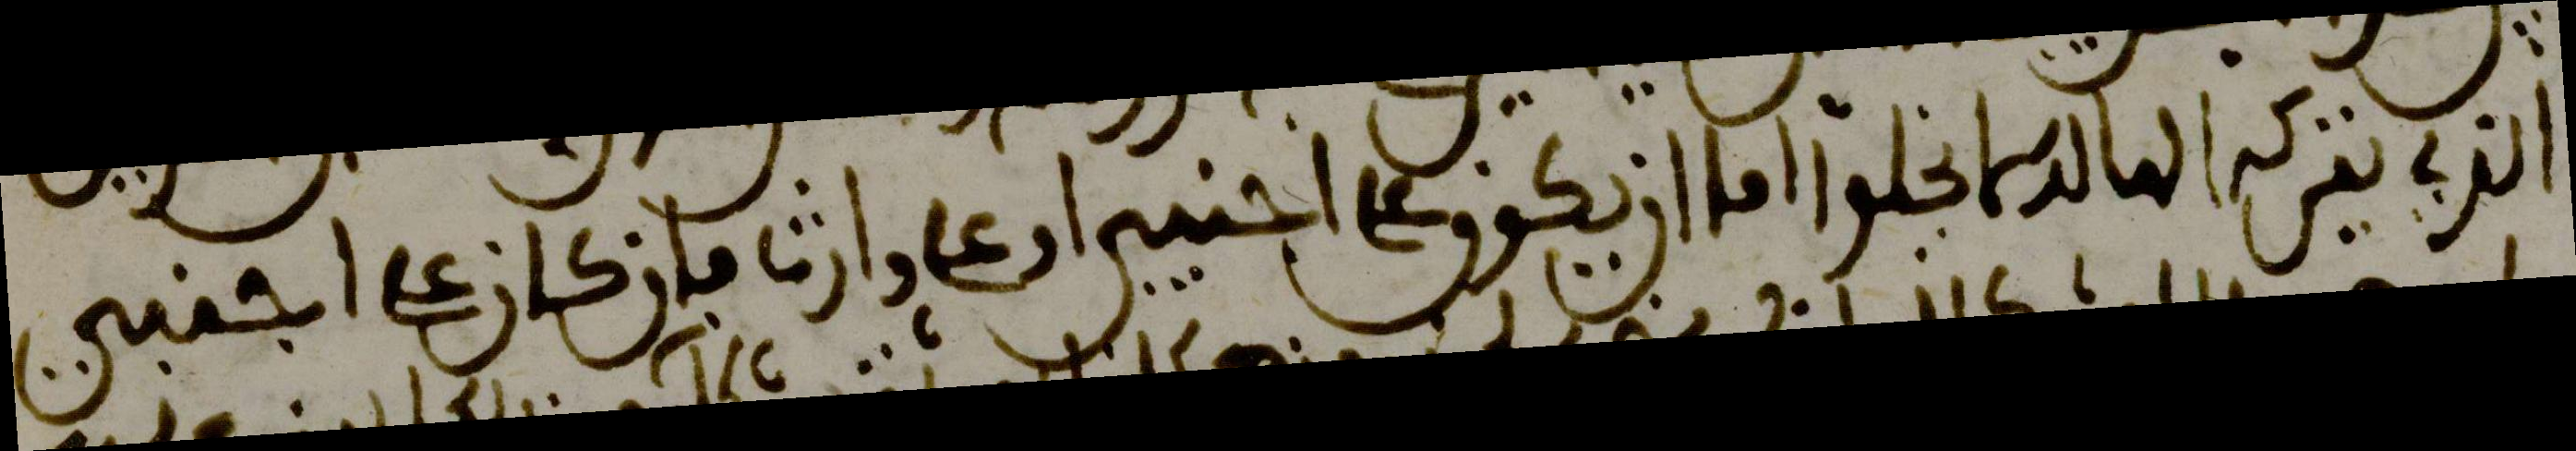الذي يتركه الهالك لا يخلوا اما ان يكون على اجنبي او على وارث فان كان على اجنبي
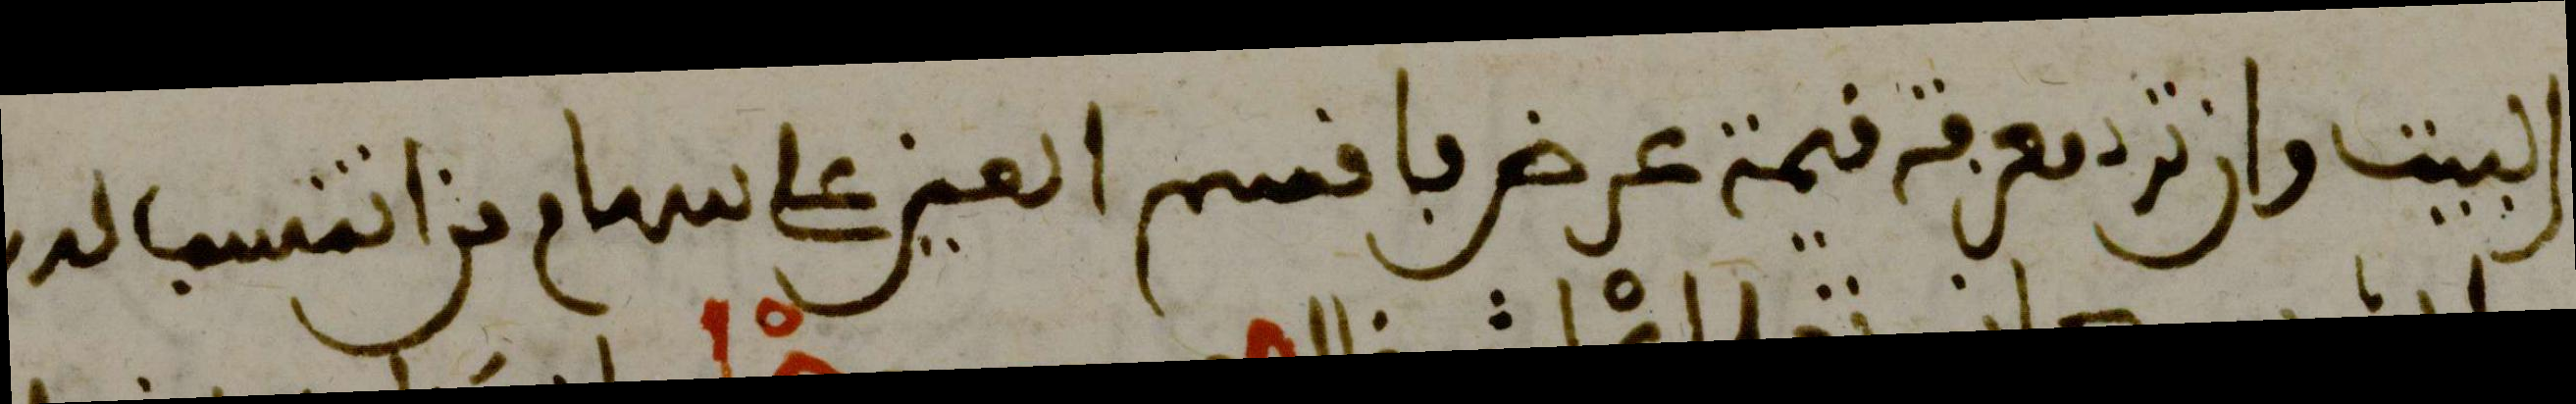البيت وان ترد معرفة قيمة عرض فاقسم العين على سهام من انتسب له
